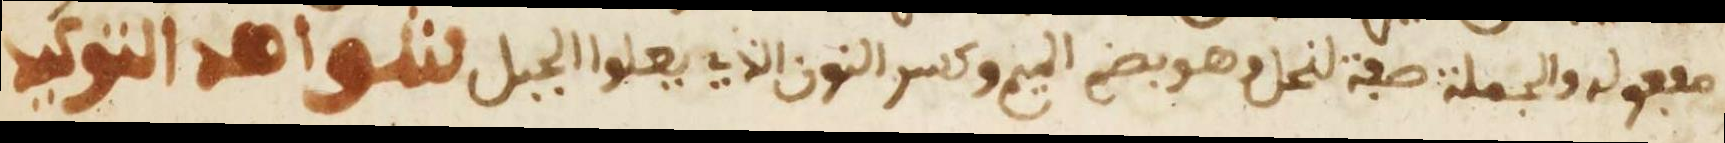مفعوله و الجملة صفة لنحل وهو بضم الميم وكسر النون الذي يعلوا الجبل شواهد التوكيد
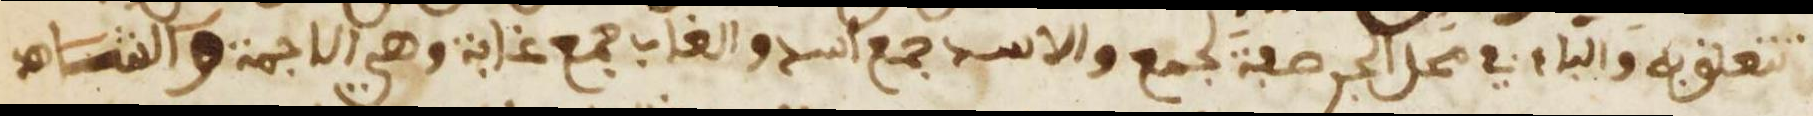تتعلق به و الباء في محل الجر صفة لجمع و الاسد جمع أسد و الغاب جمع غابة و هي الاجمة و الشاهد
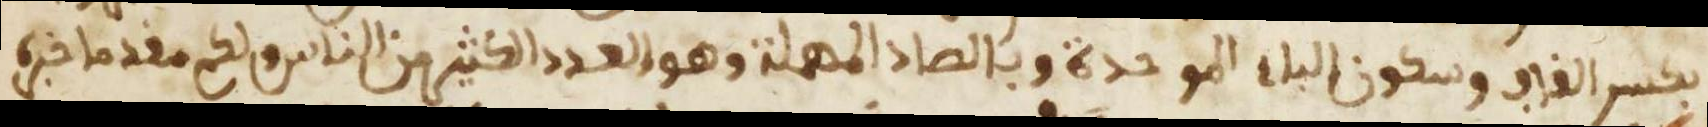بكسر القاف و سكون الباء الموحدة و بالصاد المهملة و هو العدد الكثير من الناس و لكم مقدما خبره
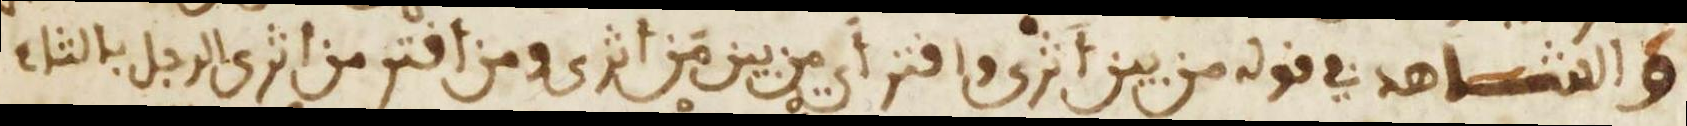و الشاهد في قوله من بين أثرى و اقتر أي من بين من أثرى و من أقتر من أثرى الرجل بالثاء
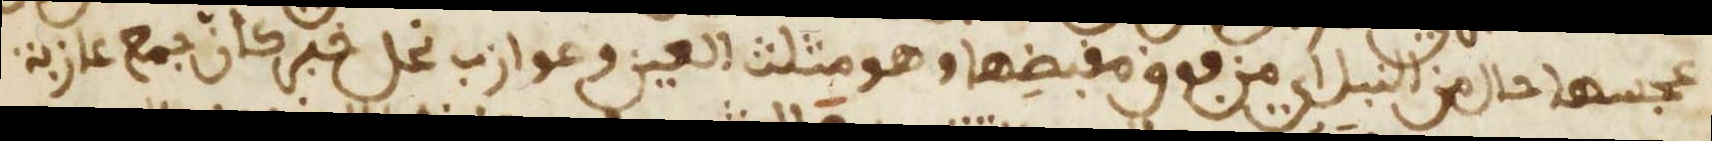27 عجسها حال من النبل اي من فوق مقبضها و هو مثلث العين و عوازب نحل خبر كأن جمع عازبة
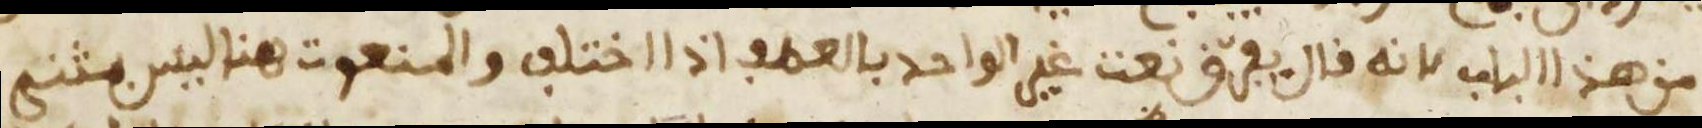من هذا الباب لانه قال يفرق نعت غير الواحد بالعطف اذا اختلف و المنعوت هنا ليس مثنى
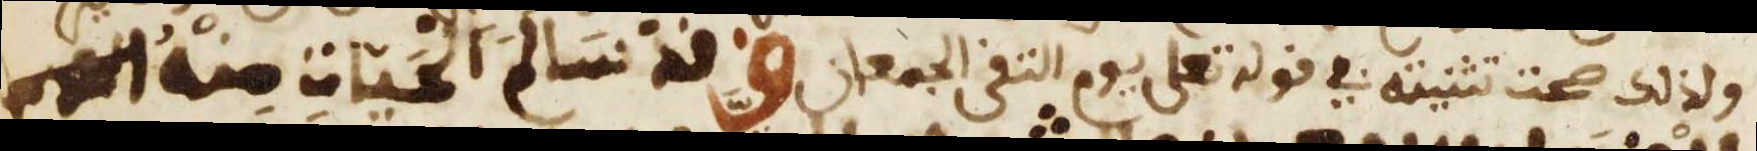ولذلك صحت تثنيته في قوله تعلى يوم التقى الجمعان ق قد سالم الحيات منه
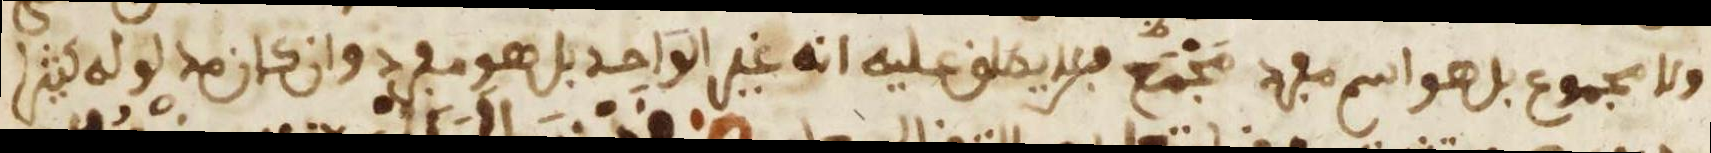ولا مجموع بل هو اسم مفرد مجمع فلا يطلق عليه انه غير الواحد بل هو مفرد و ان كان مدلوله كثيرا
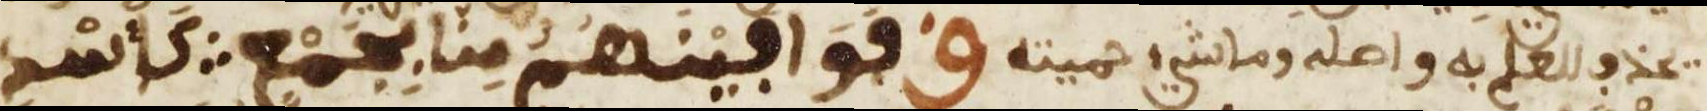يحذف للعلم به و اصله و ما شيء حميته ق فوافينهم منا بجمع كأسد
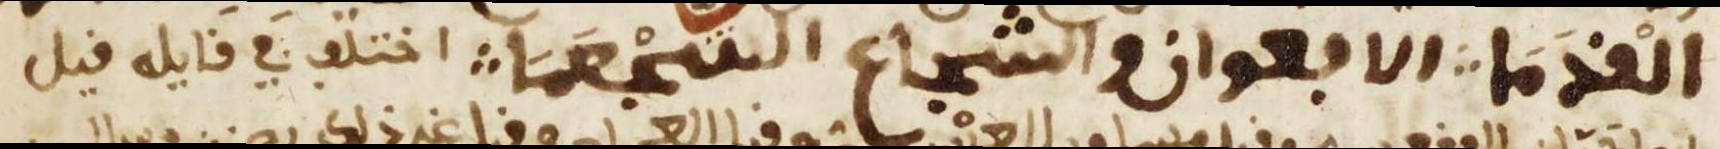القدما الافعوان و الشجاع الشجعما اختلف في قايله قيل
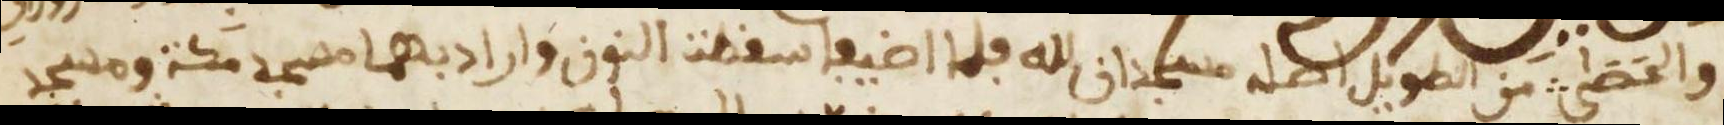و الحصى من الطويل اصله مسجدان لله فما اضيفا سقطت النون و اراد بهما مسجد مكة و مسجد
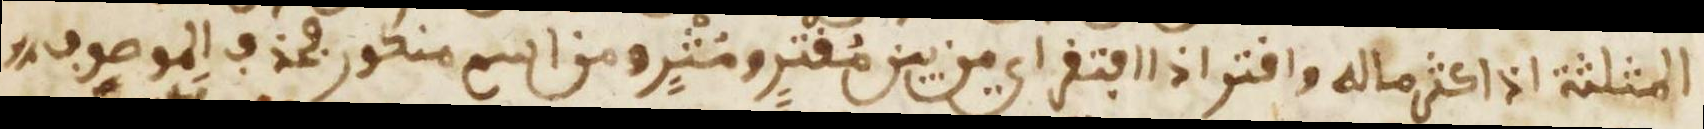المثلثة اذا كثر ماله و اقتر اذا افتقر اي من بين مقتر و مثر و من اسم منكور فحذف الموصوف
